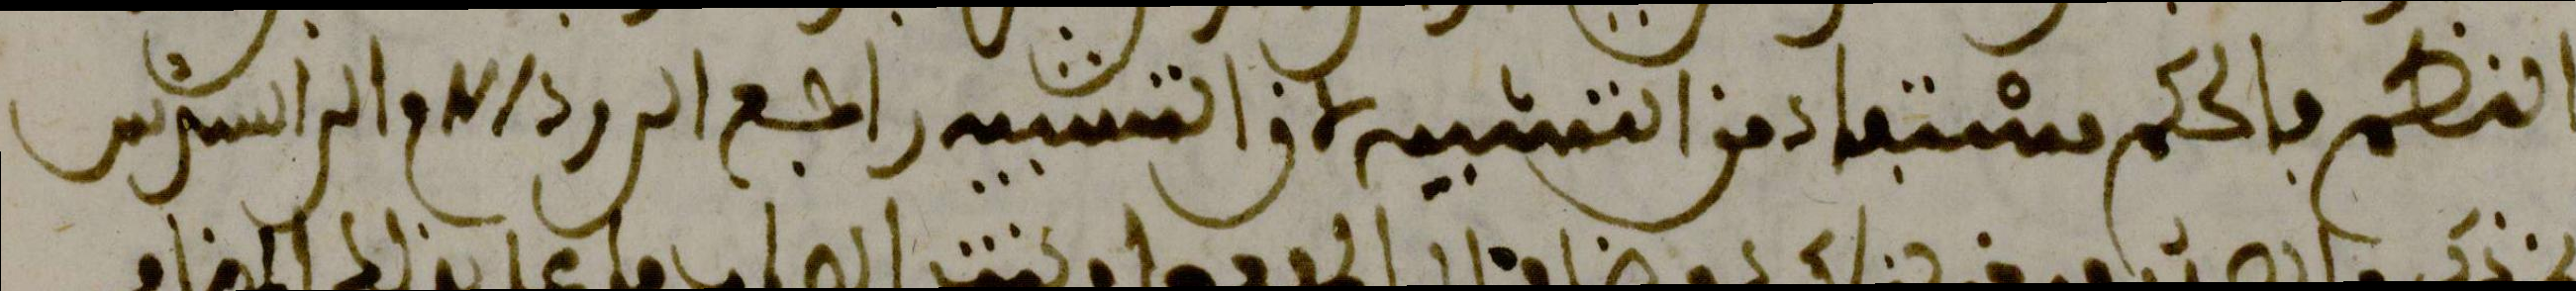النظم فالحكم مسْتفاد من التشبيه لان التشبيه راجع الى رد الام الى السدس
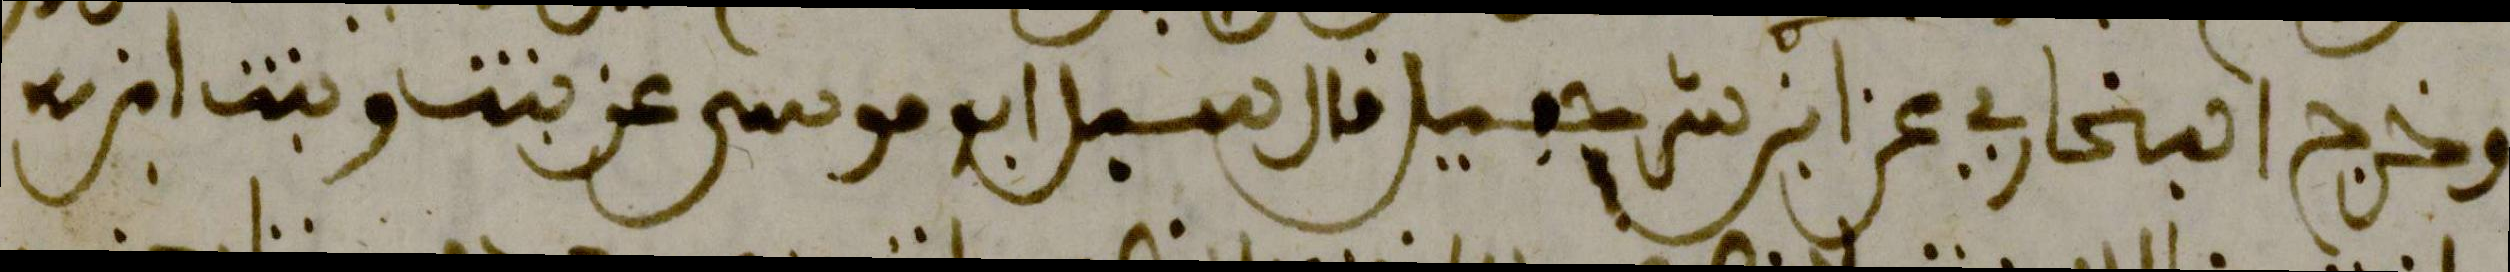وخرج البخاري عن ابن شر حبيل قال سئل ابو موسى عن بنت وبنت ابن
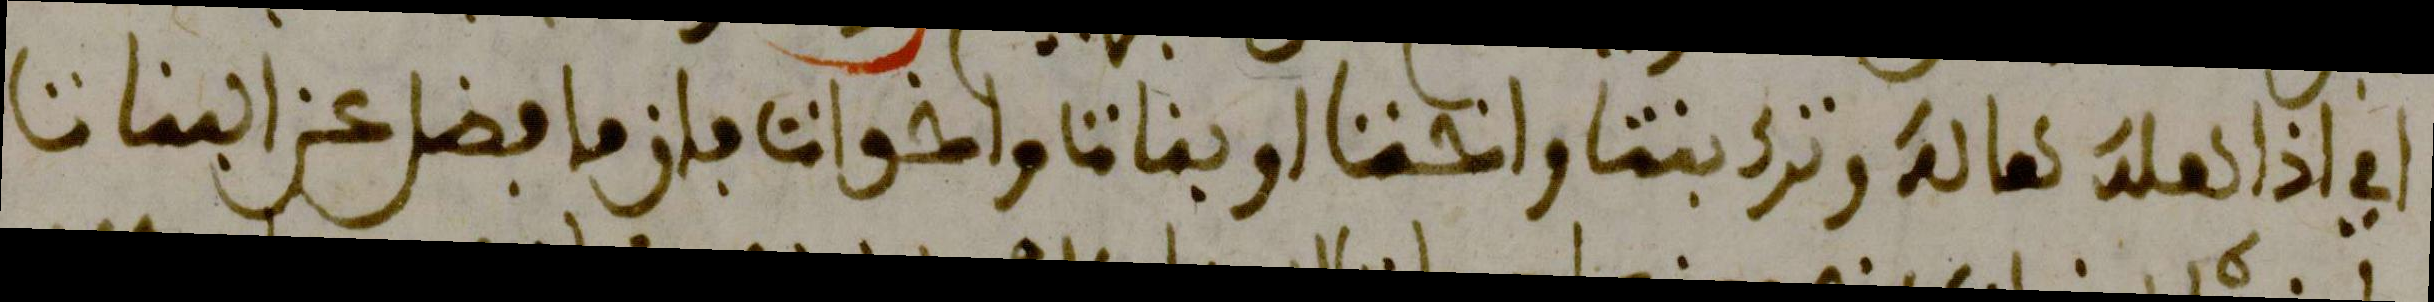اي اذا هلك هالك وترك بنتا واختا او بنات واخوات فان ما فضل عن البنات
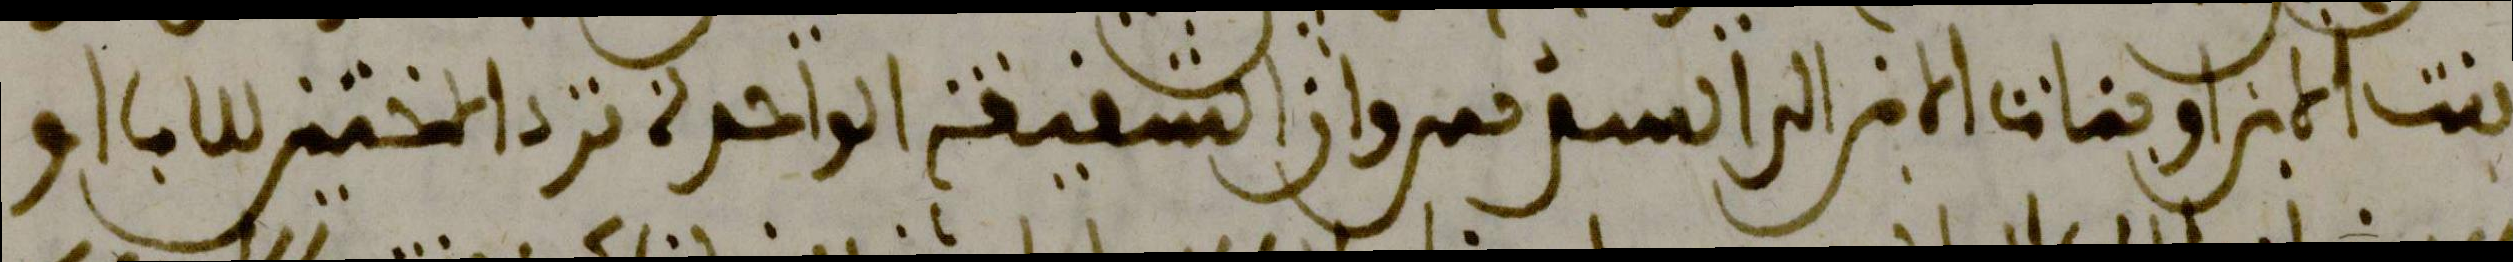بنت الابن او بنات الابن الى السدس وان الشقيقة الواحدة ترد الاختين للاب او
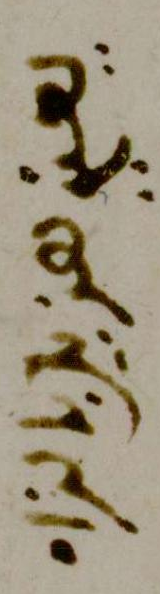يعني تعزيل بالزاء
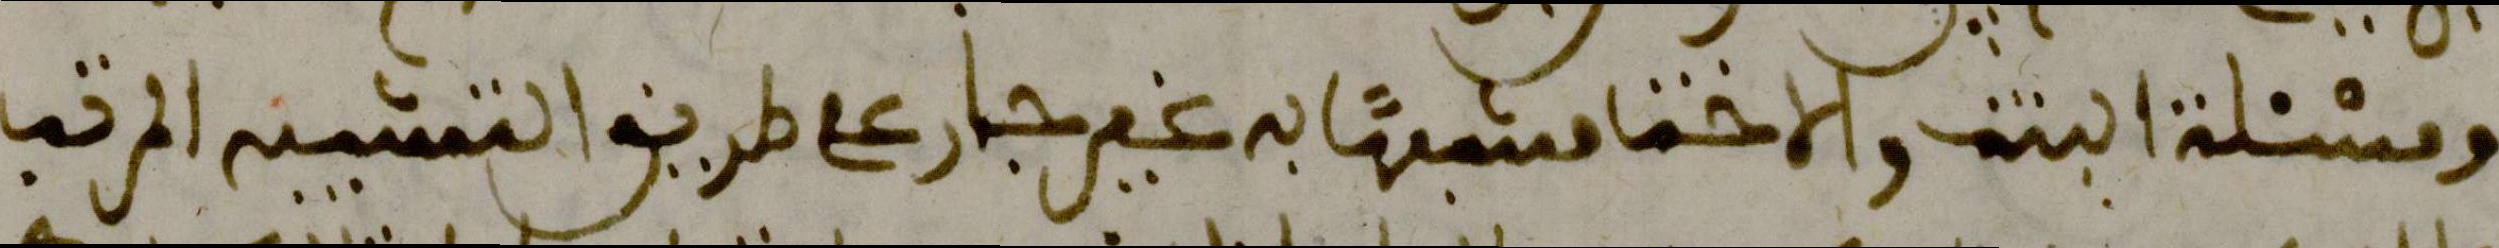ومسْئلة البنت والاخت مشبها به غير جار على طريق التشبيه المرتب
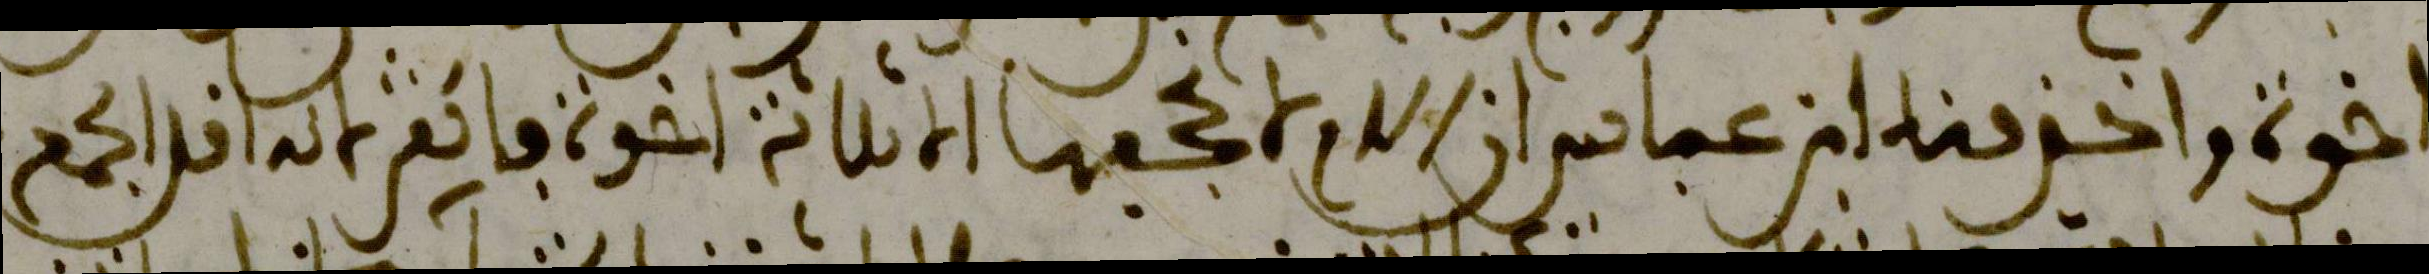اخوة واخذ منه ابن عباس ان الام لا يحجبها الا ثلاثة اخوة فاكثر لانه اقل الجمع
